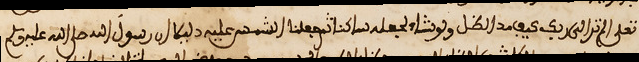تعلى لم تر الى ربك كيف مد الظل ولو شاء لجعله ساكنا ثم جعلنا الشمس عليه دليلا ان رسول الله صلى الله عليه وسلم
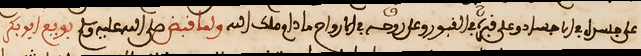على جسده في الاجساد وعلى قبره في القبور وعلى روحه في الارواح ما دام ملك الله ولما قبض صلى الله عليه وسلم بويع ابو بكر
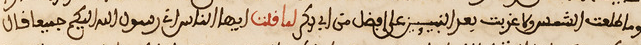وما طلعت الشمس ولا غربت بعد النبيئين على افضل من ابى بكر لما قلت ايها الناس انى رسول الله اليكم جميعا قال
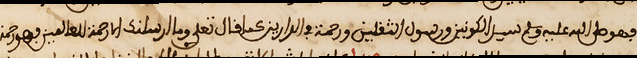فهو صلى الله عليه وسلم سيد الكونين ورسول الثقلين ورحمة في الدارين كما قال تعلى وما ارسلنك الا رحمة للعالمين فهو رحمة
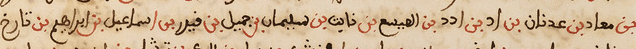بن معاد بن عدنان بن اد بن ادد بن العيسع بن نابت بن سليمان بن جميل بن قيدر بن اسماعيل بن ابراهيم بن تارخ
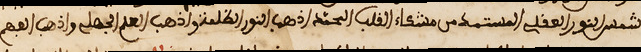شمس النور العقلى المستمد من مشكاء القلب المحمد اذهب النور الظلمة واذهب العلم الجهلى واذهب الفهم
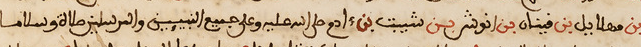بن مهلايل بن قينان بن انوش بن شيت بن ءادم صلى الله عليه وعلى جميع النبيين والمرسلين صلاة وسلاما
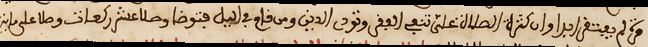مرة لم يفتقر ابدا وان كثرة الصلاة على تنقى الفقر وتردى الدين ومن قام في اليل فتوضا وصلا عشر ركعات وصلا على ماية
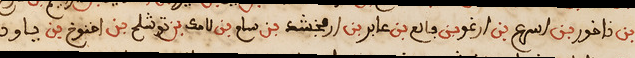بن ناخور بن اسرع بن ارغو بن فالع بن عابر بن ارفخشد بن سام بن لامك بن توشلح بن اخنوخ بن ياود
